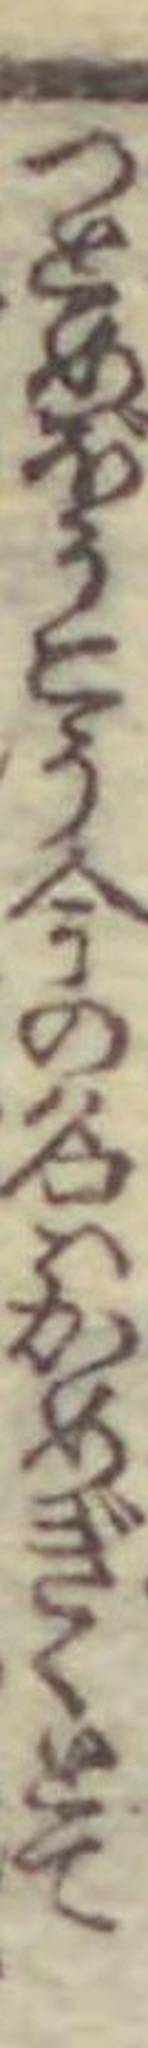つとめぼうこう今の名はかめぎくとて
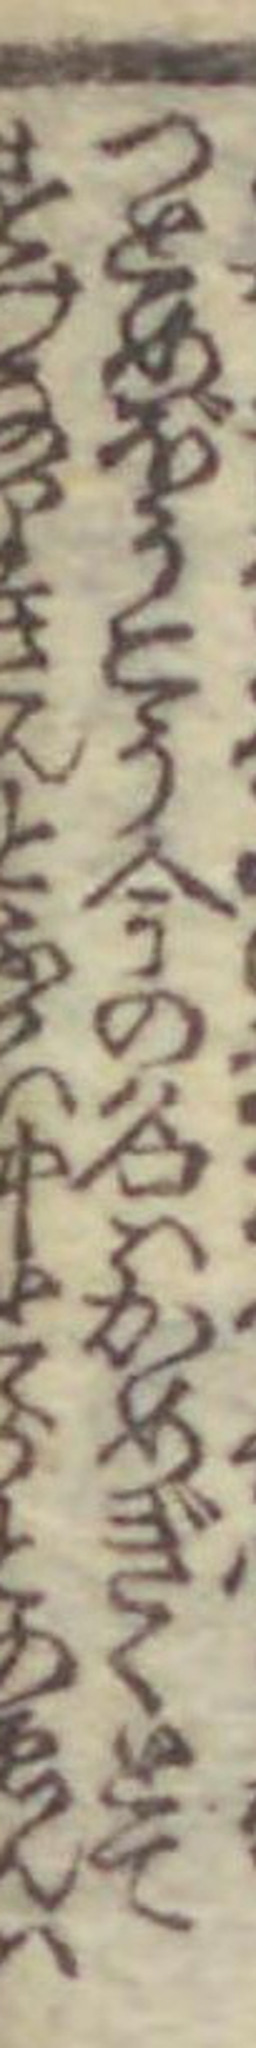すけなりさんとふかい中とらとのゑんは
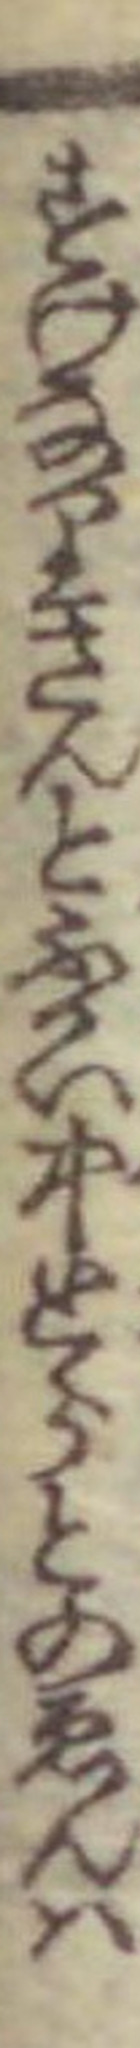すけなりさんとふかい中とらとのゑんは
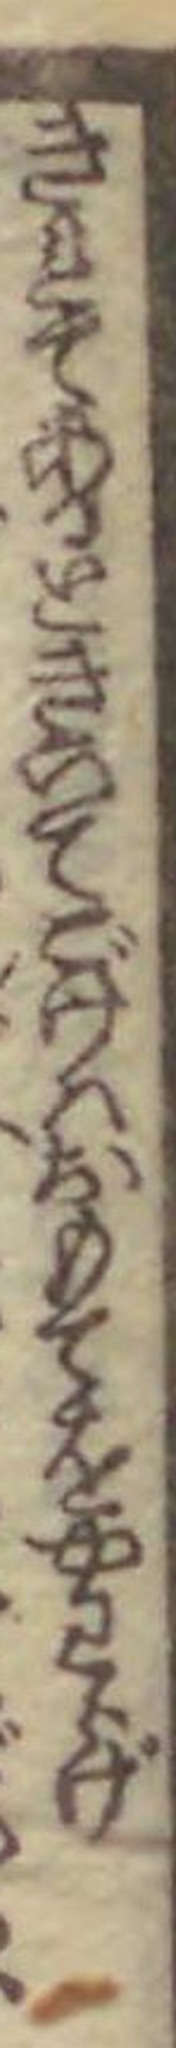きれてあるときいてごけはおもてをやわらげ
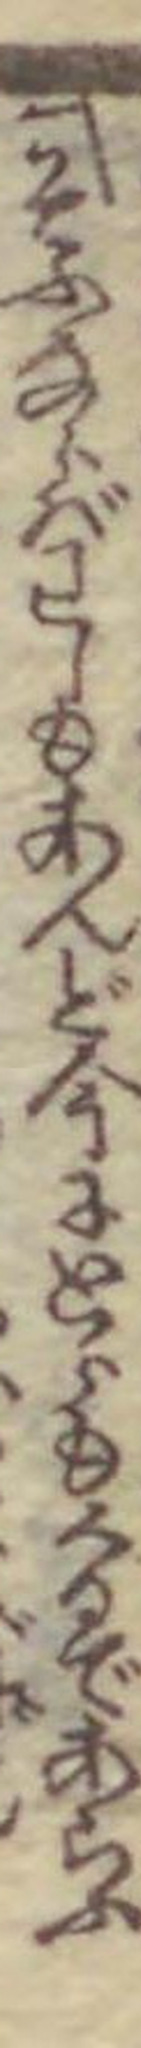〽そふならばわしもあんど今にとらもくるであらふ
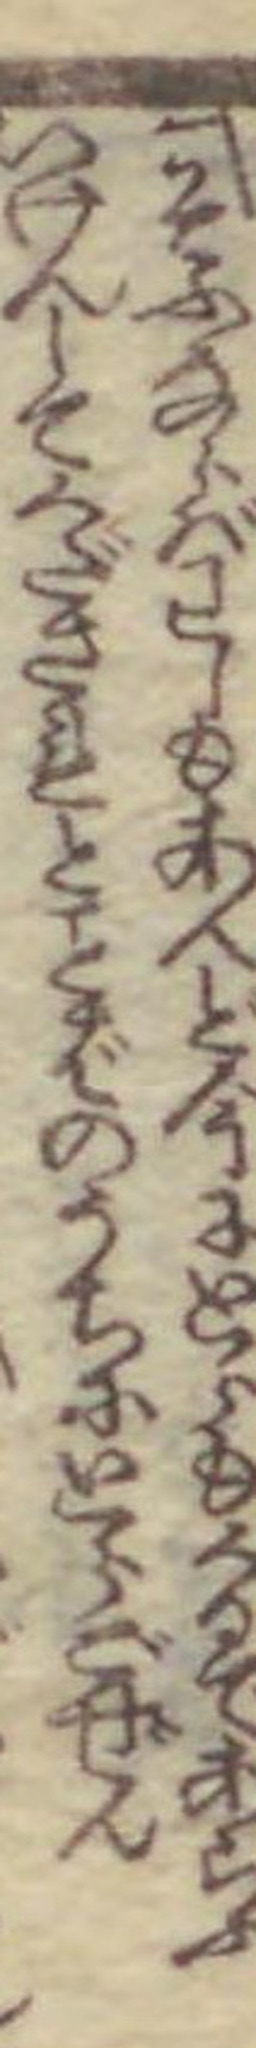いけんしてくだされとことばのうちにとらごぜん
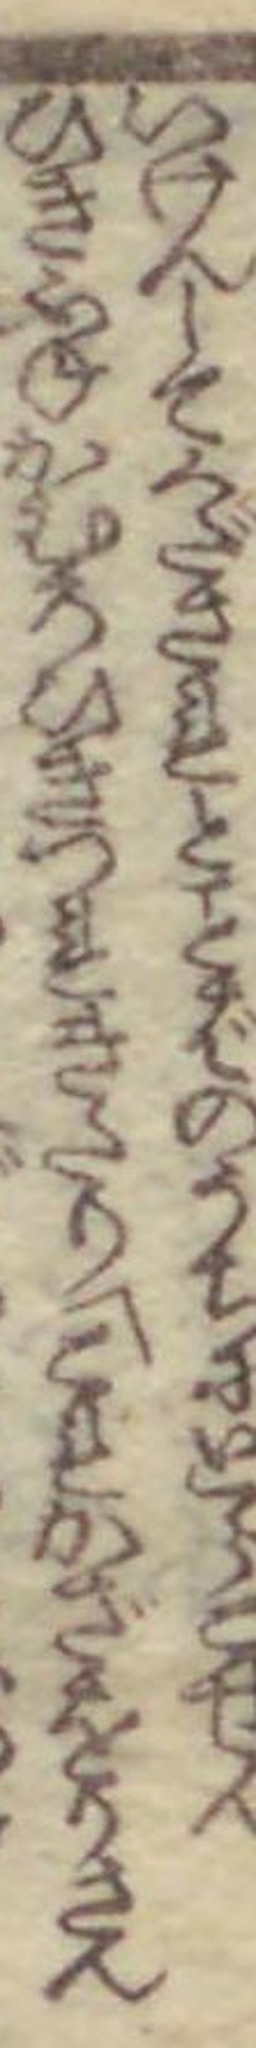ひきふねかむろひきつれきたり〽これかざをりさん
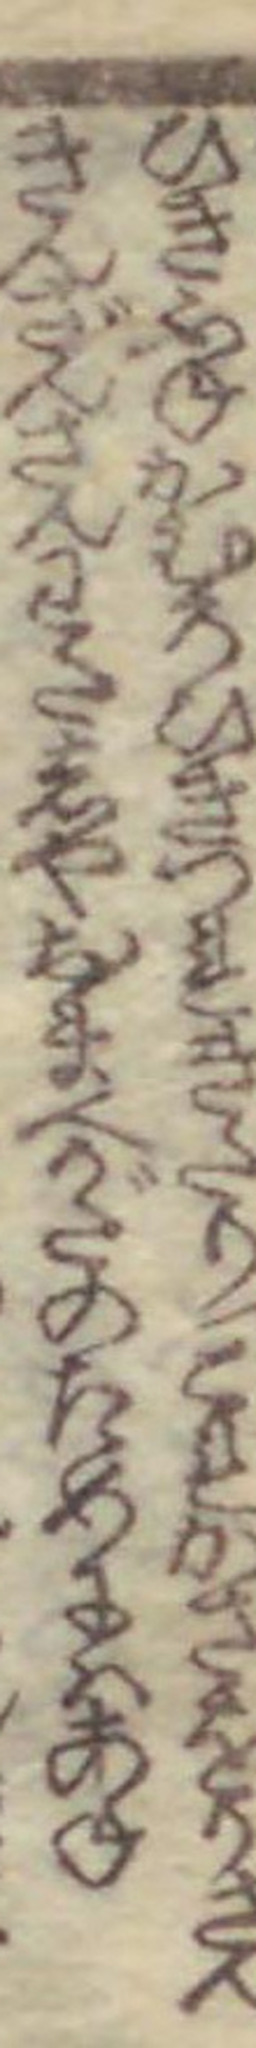きんざんさんわたしやおまへがたのためにはあね
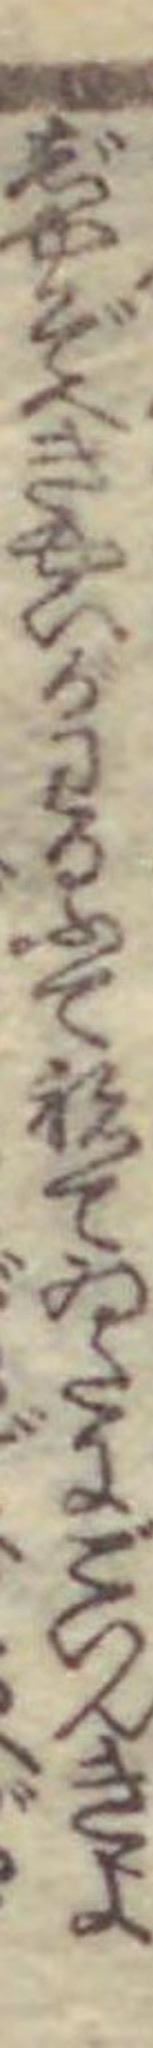じやぞへきやいがわるふてねてゐたにごいんきよ
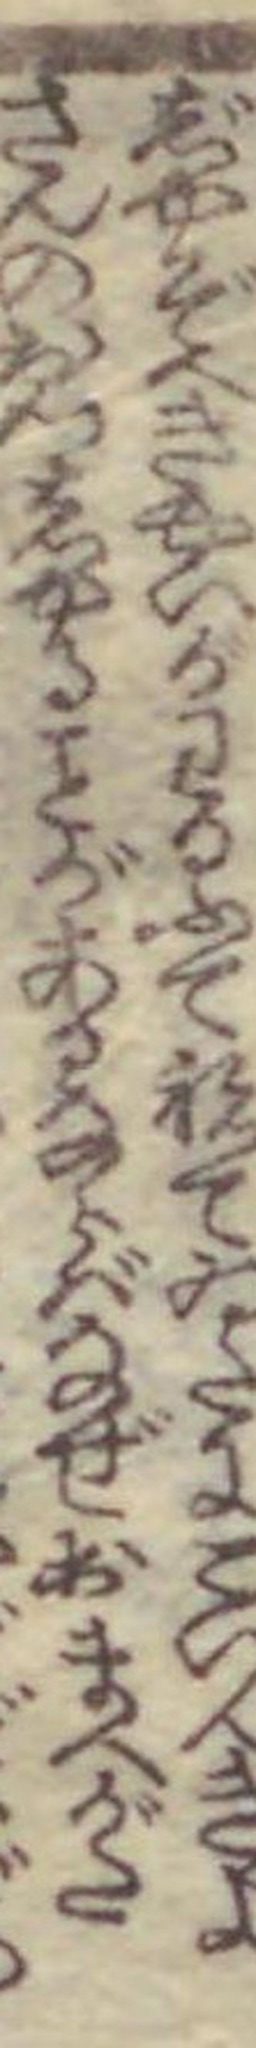さんのおつしやることがあるならばなぜおまへがた
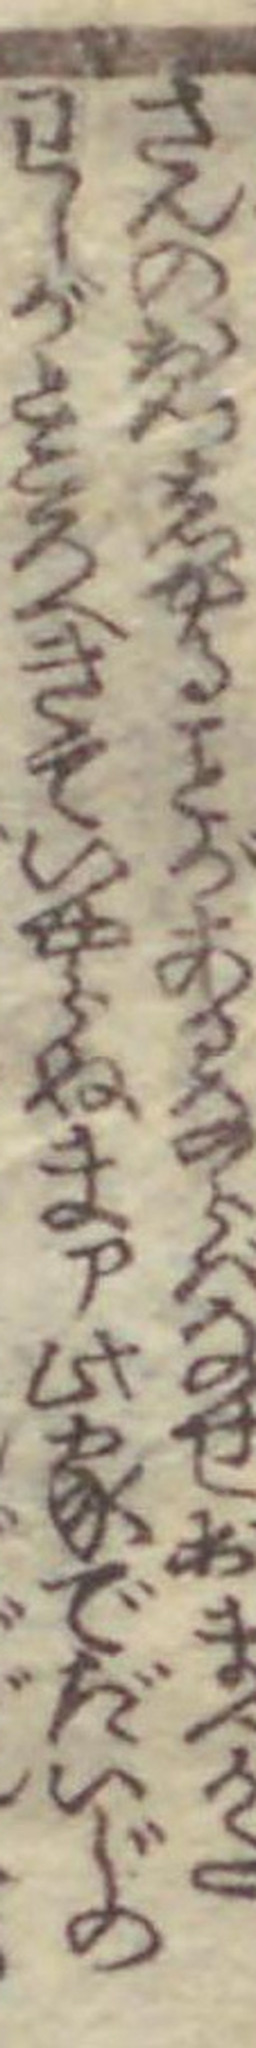わしがところへきていやらぬまァ此家でだいじの
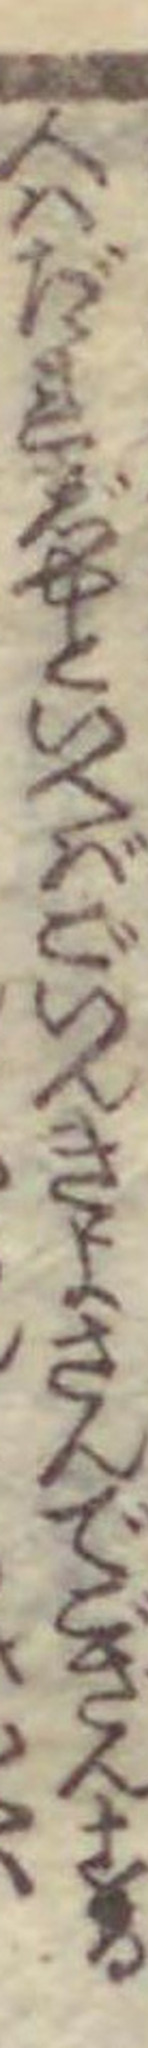人はだれじやといへばごいんきよさんでござんする
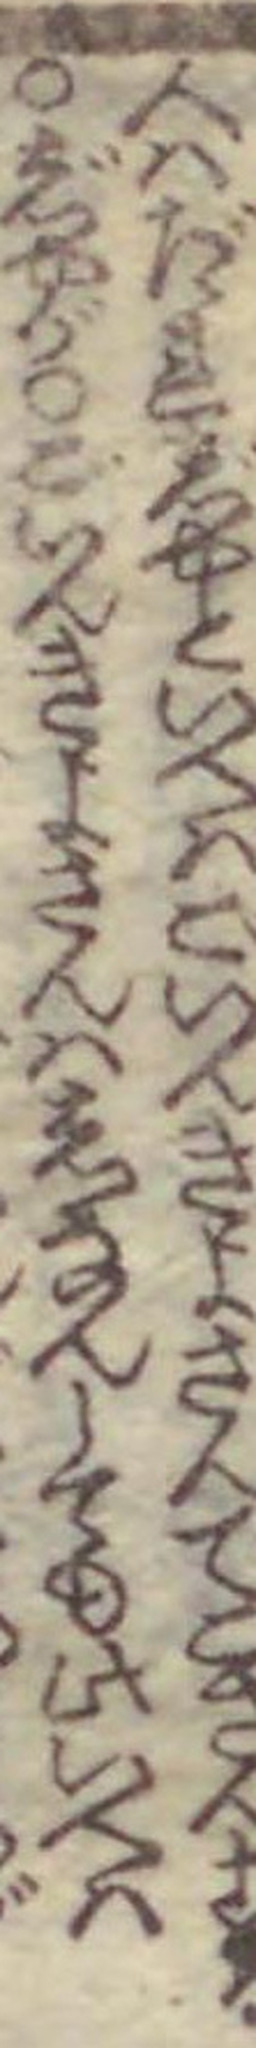○じやが○ごいんきよさんはしなんしても此いへは
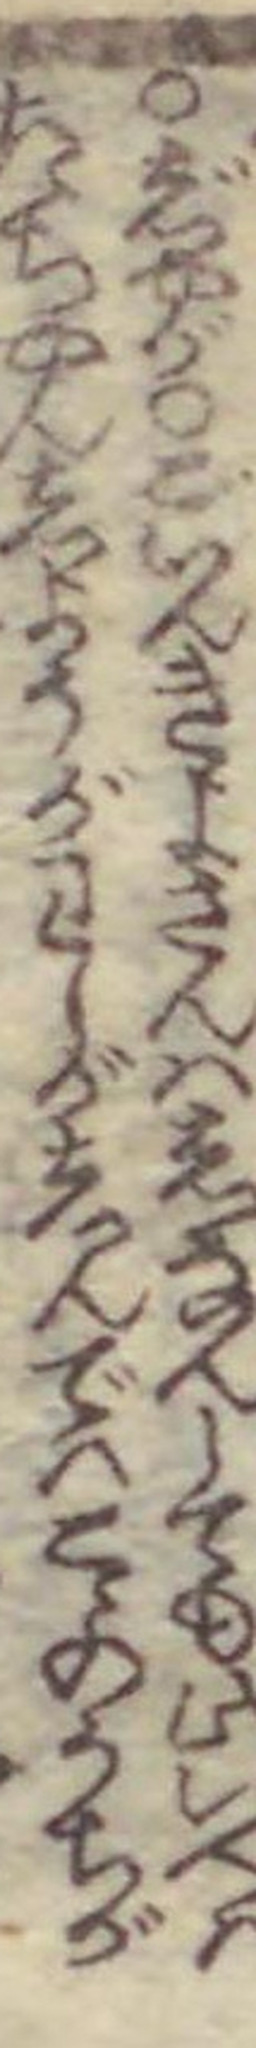たちやんしようがわしがしんではこゝのうちが
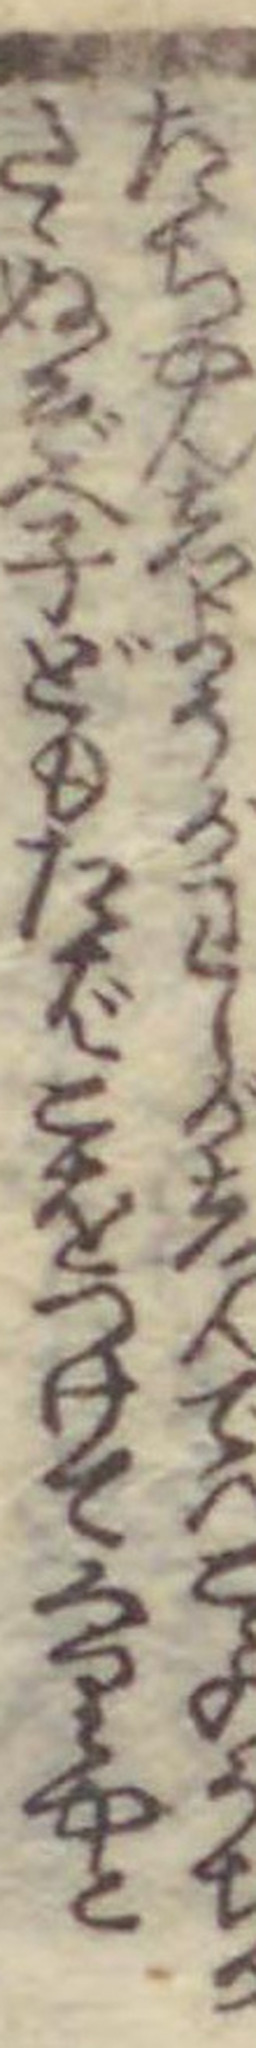たゝぬぞへ子どもたばこをつけてくりやと
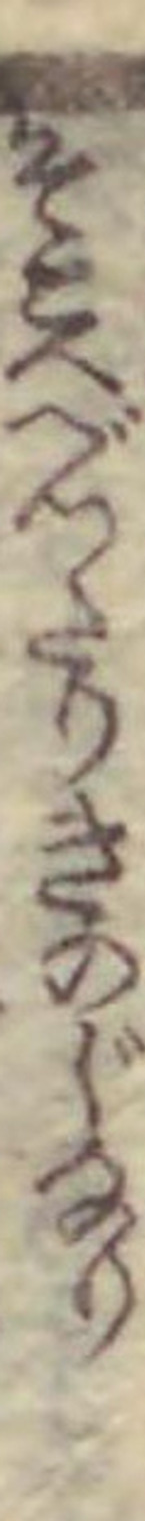そこへべつたりきのじなり
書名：大時代唐土化物 3巻. 曽我太夫染
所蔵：国立国会図書館 National Diet Library, JAPAN
